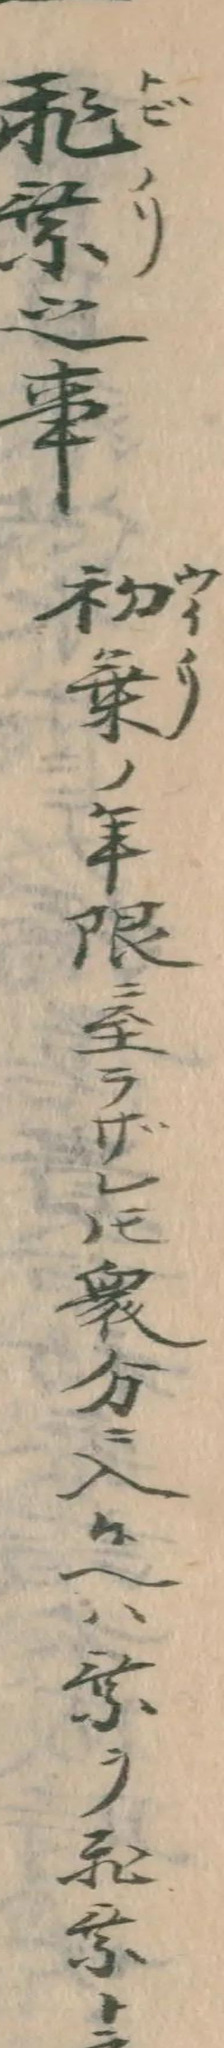一飛乗之事初乗ノ年限ニ至ラザレトモ衆分ニ入候へハ乗ヲ飛乗ト云
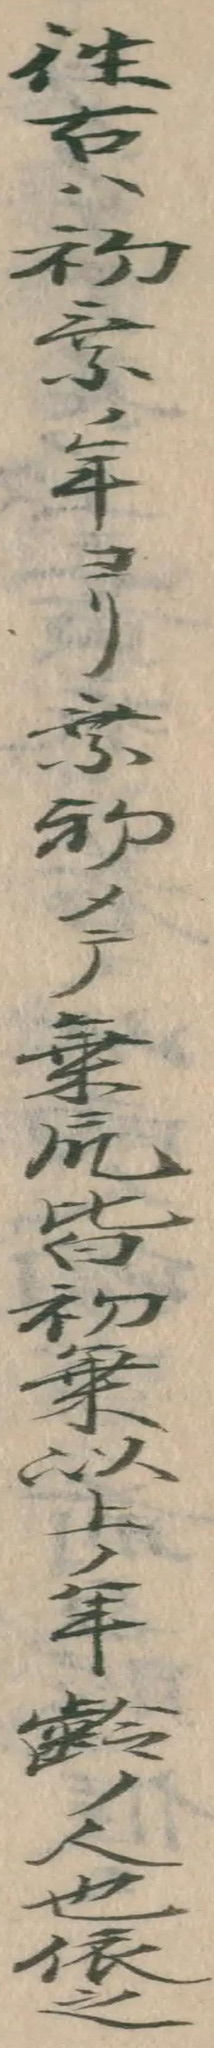往古ハ初乗ノ年ヨリ乗初メテ乗尻皆初乗以上ノ年齢ノ人也依之
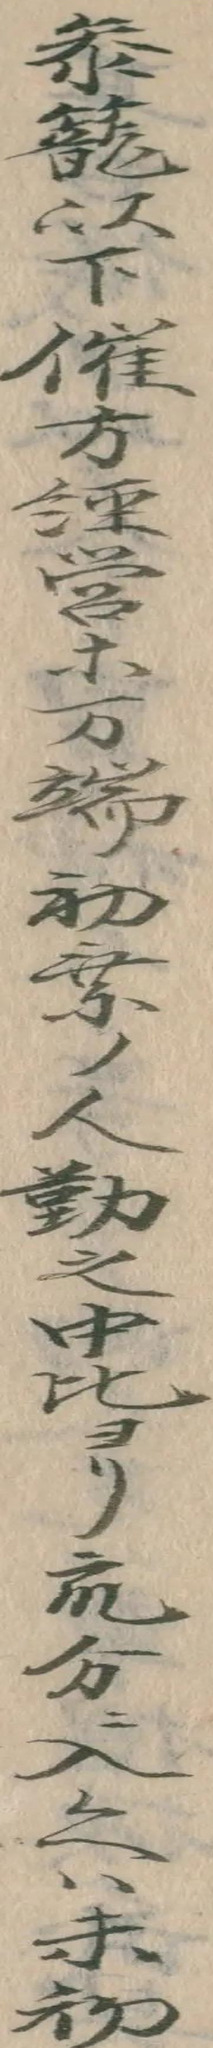参籠以下催方経営等万端初乗ノ人勤之中比ヨリ衆分ニ入候へハ未初
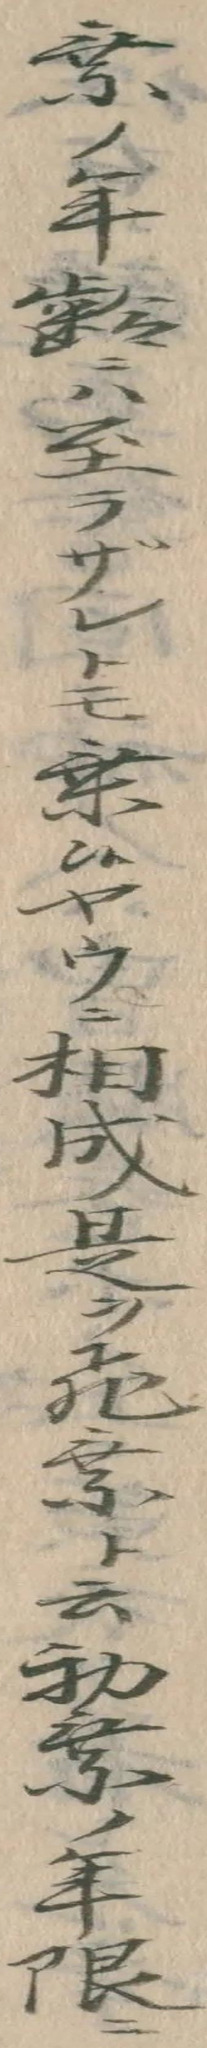乗ノ年齢ニハ至ラザレトモ乗候ヤウニ相成是ヲ飛乗ト云初乗ノ年限ニ
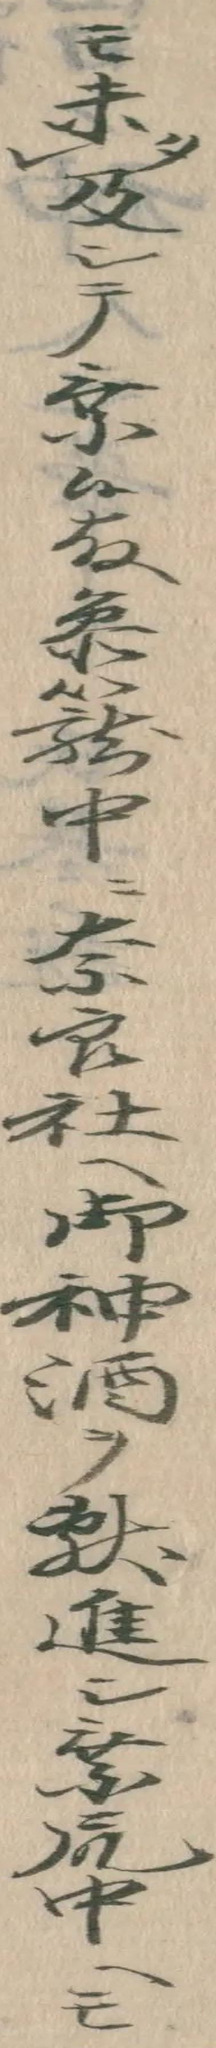モ未及シテ乗候故参籠中ニ奈良社へ御神酒ヲ献進シ乗尻中ヘモ
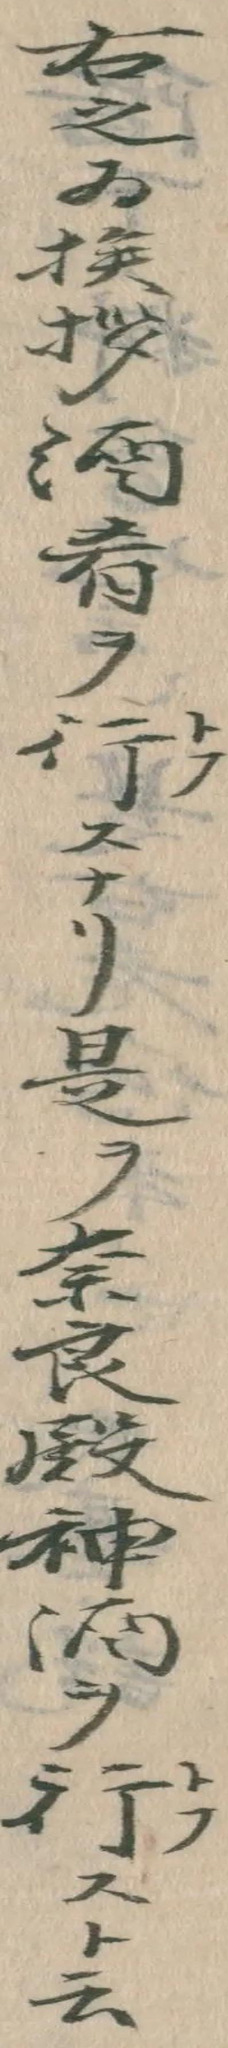右之為挨拶酒肴ヲ行スナリ是ヲ奈良殿神酒ヲ行スト云
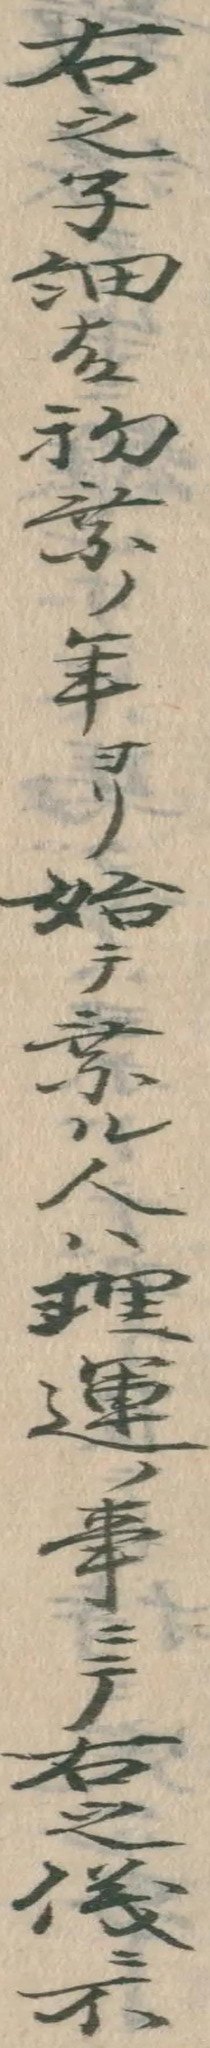右之子細故初乗ノ年ヨリ始テ乗ル人ハ理運ノ事ニテ右之儀ニ不
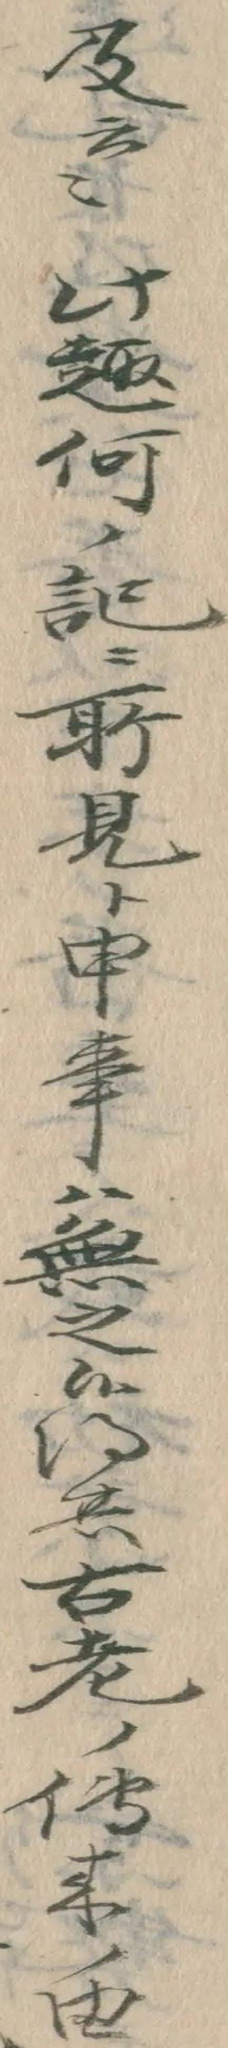及云々此趣何ノ記ニ所見ト申事ハ無之候得共古老ノ伝来ノ由
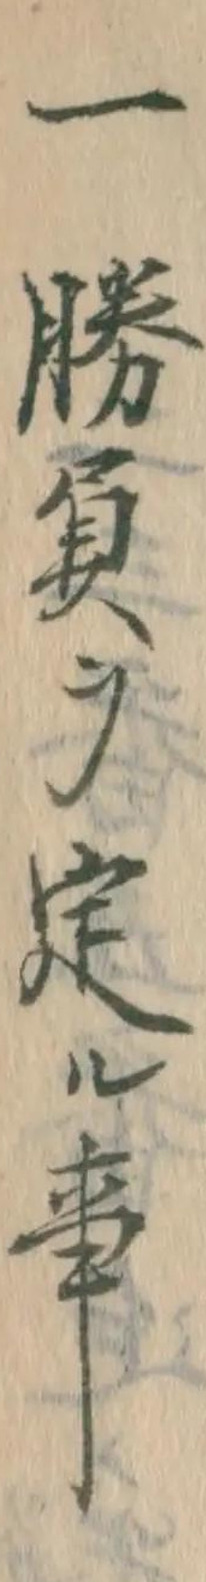一勝負ヲ定ル事

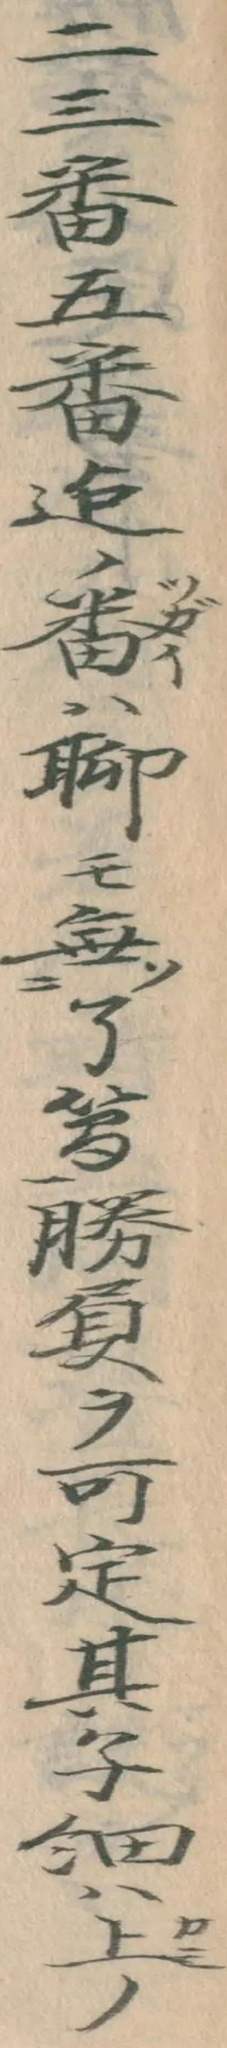二三番五番迄ノ番ハ聊モ無了簡勝負ヲ可定其子細ハ上ノ
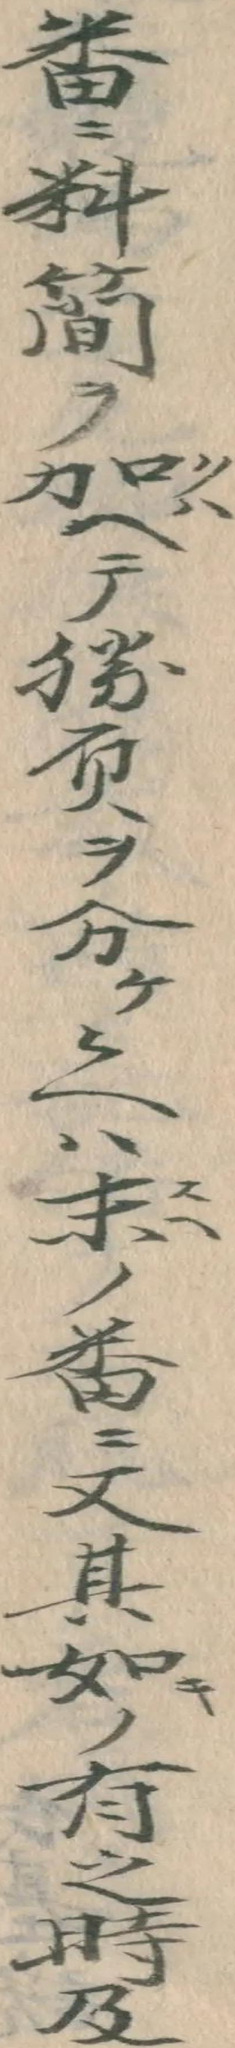番ニ料簡ヲ加ヘテ勝負ヲ分ケ候ヘハ末ノ番ニ又其如ノ有之時及
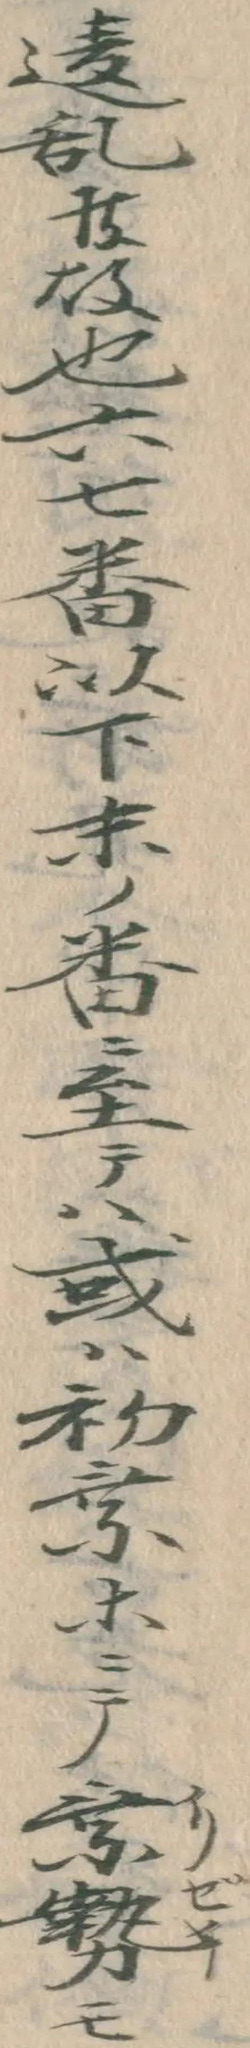違乱存故也六七番以下末ノ番ニ至テハ或ハ初乗等ニテ乗勢モ
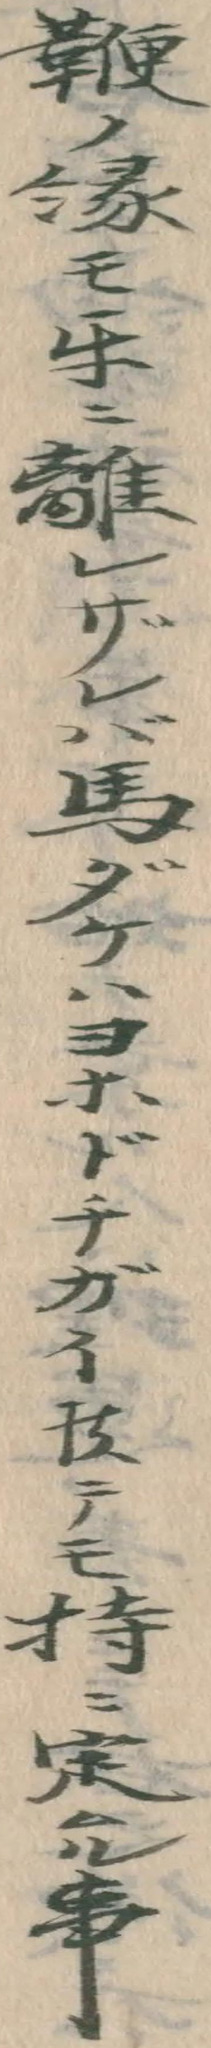鞭ノ縁モ互ニ離レザレバ馬ダケハヨホドチガイ在テモ持ニ定ムル事
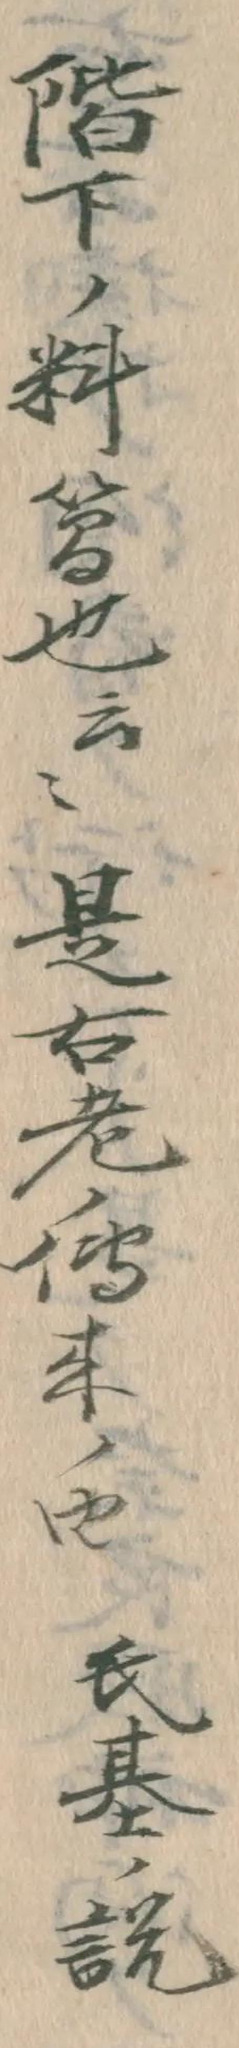階下ノ料簡也云々是古老伝来ノ由氏基ノ説
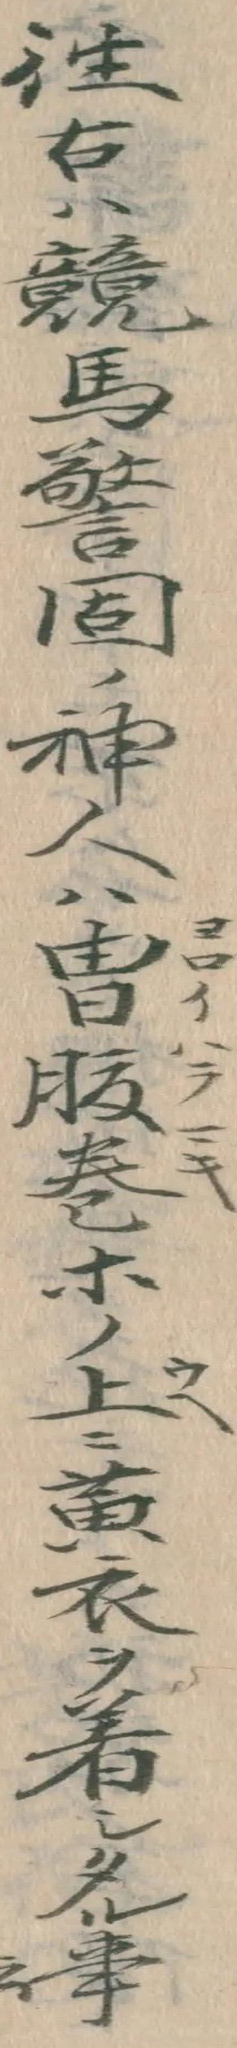往古ハ競馬警固ノ神人ハ冑腹巻等ノ上ニ黄衣ヲ着シタル事云々
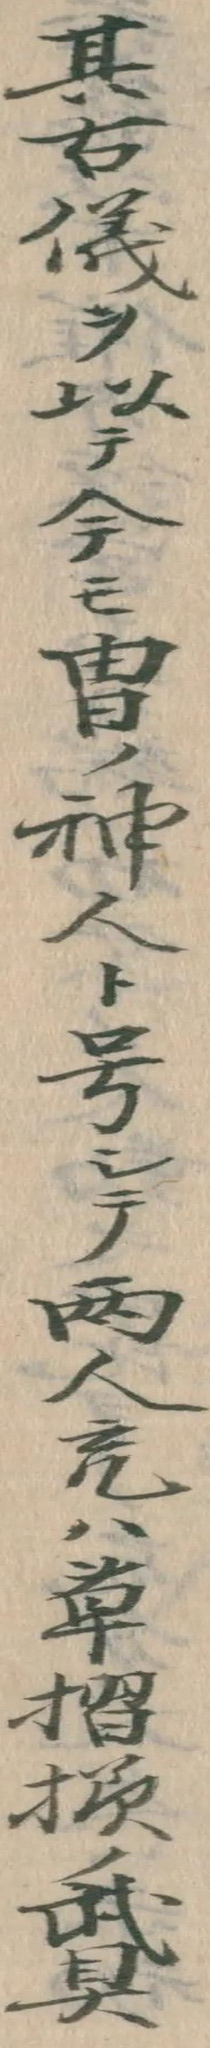其古儀ヲ以テ今モ冑ノ神人ト号シテ両人充ハ草摺様ノ武具
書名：賀茂社記録. 第11冊
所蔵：国立国会図書館 National Diet Library, JAPAN
